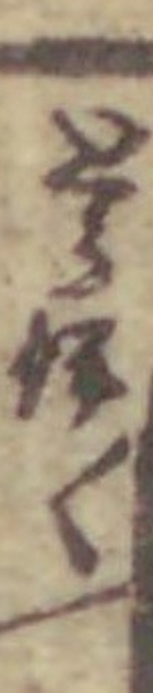とう伊〳〵
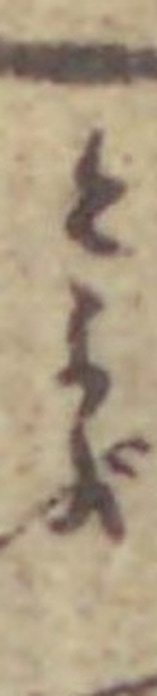とよぶ
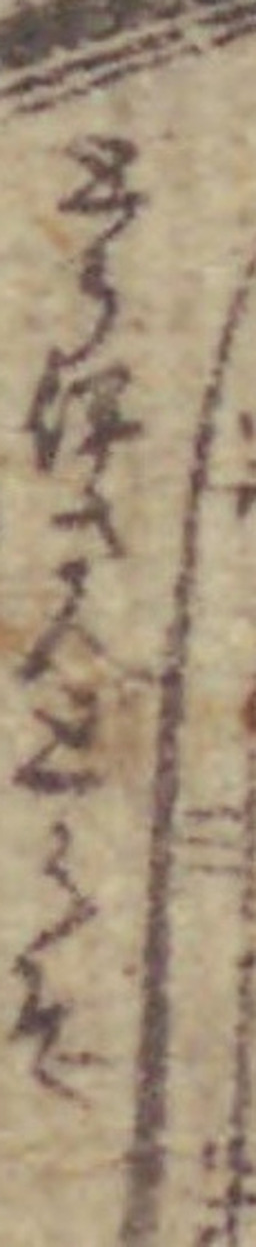とう伊さんとうぞ
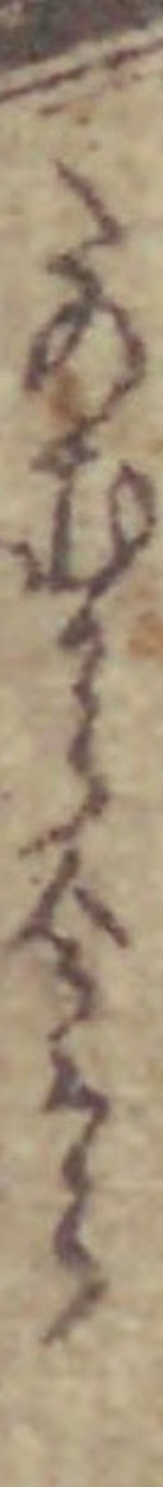たのむから今から
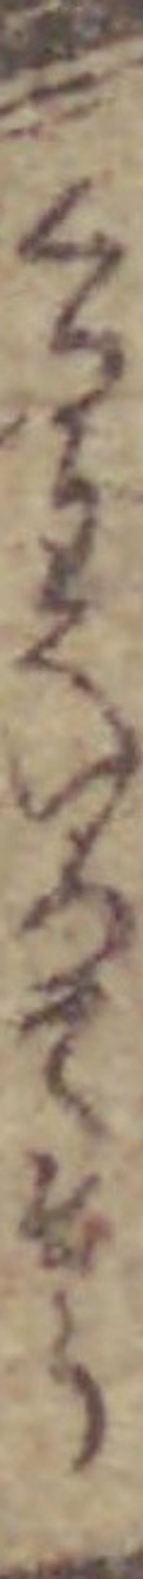くるわへいつてそう
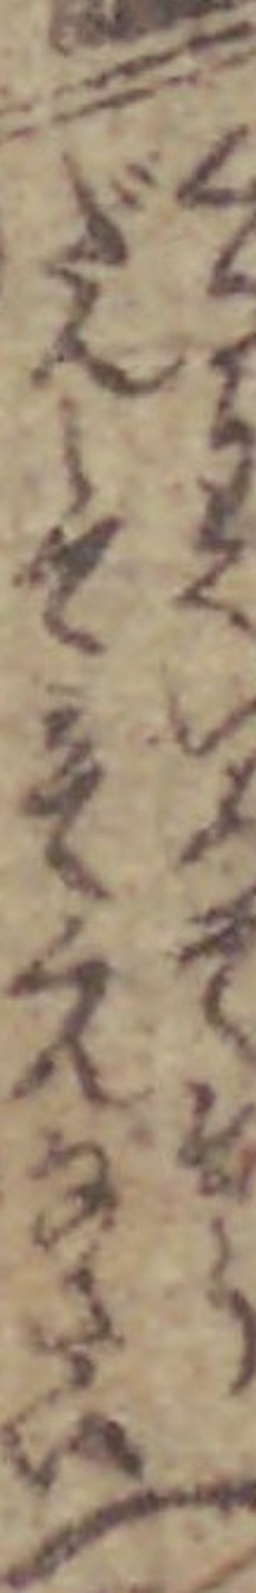だんしてみてくんなさい
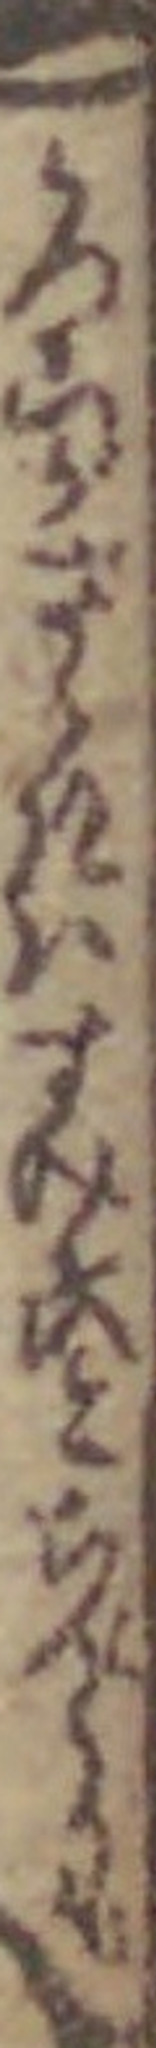かつ山がざしきはすけ六とちん〳〵かも
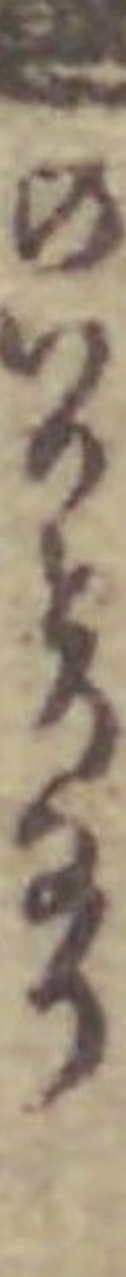のいりとりなり
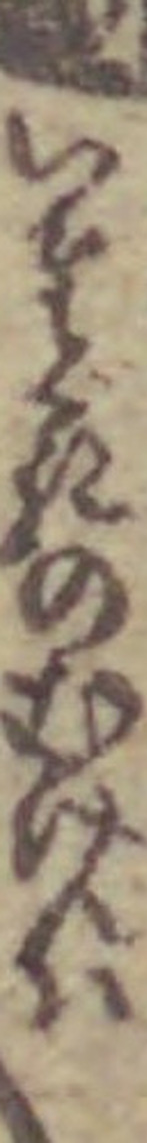いまときのむけんは
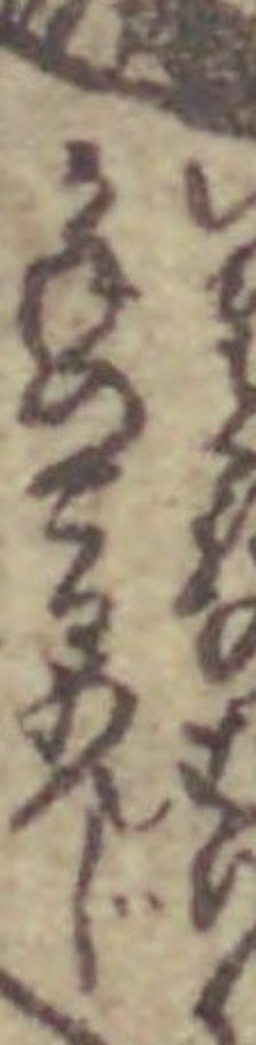かねのてるあんじ
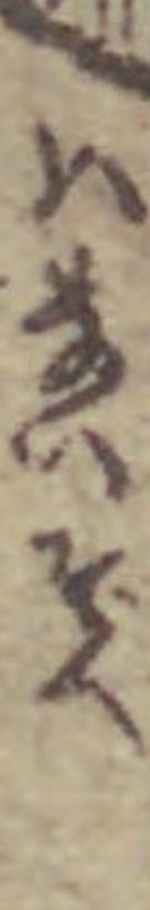はないぞへ
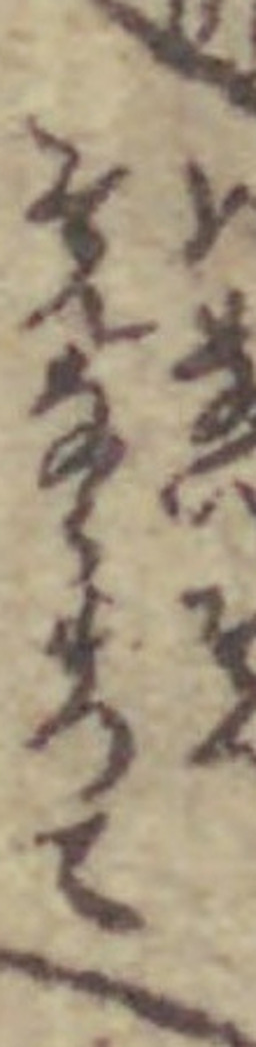そんならまつて
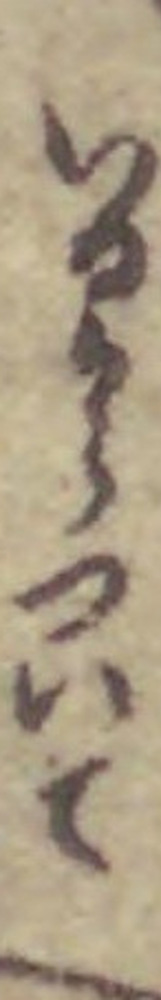いるからついて
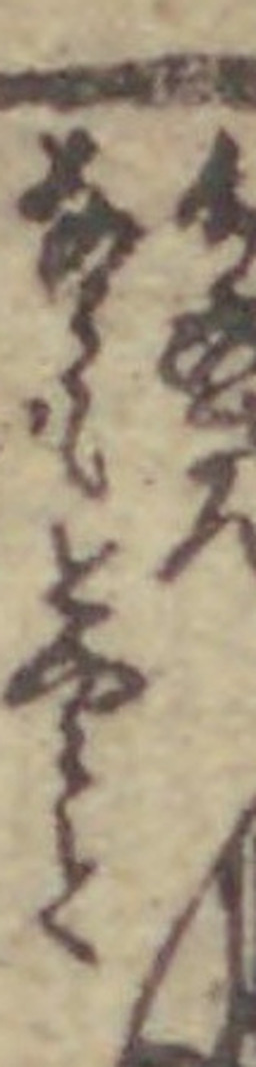ならもとやらと
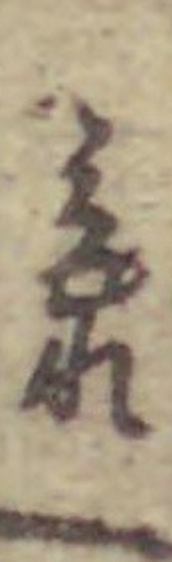みやれ
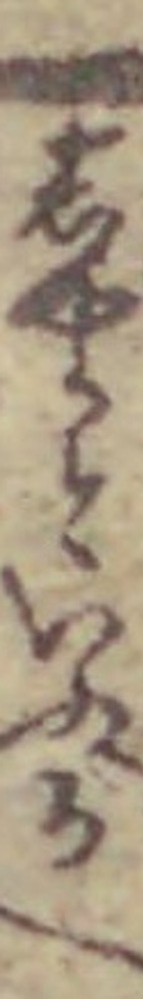しやうといふが
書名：大通其面影 2巻
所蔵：国立国会図書館 National Diet Library, JAPAN
